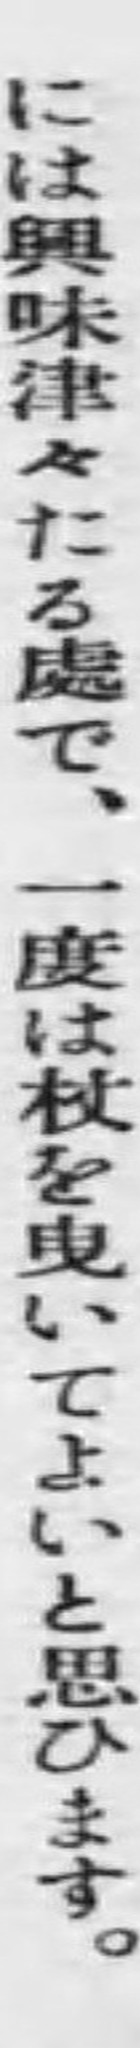には興味津々たる処で、一度は杖を曳いてよいと思ひます。
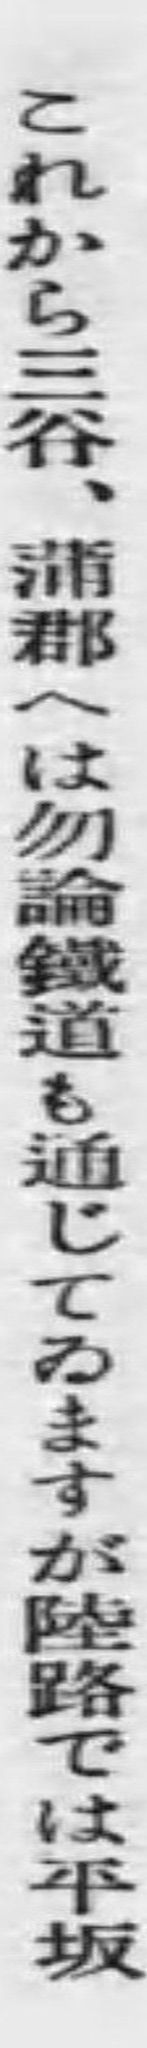これから三谷、蒲郡へは勿論鉄道も通じてゐますが陸路では平坂
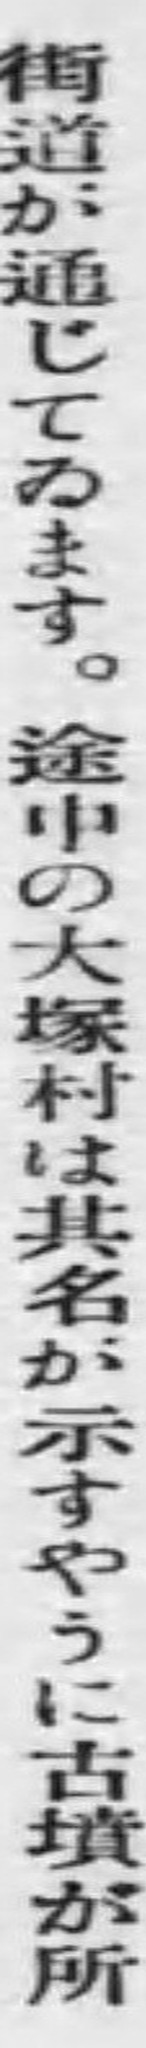街道が通じてゐます。途中の大塚村は其名が示すやうに古墳が所
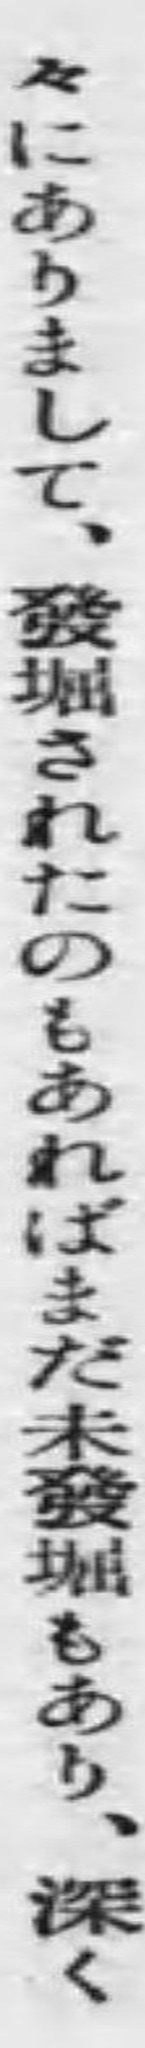々にありまして、発堀されたのもあればまだ未発堀もあり、深く
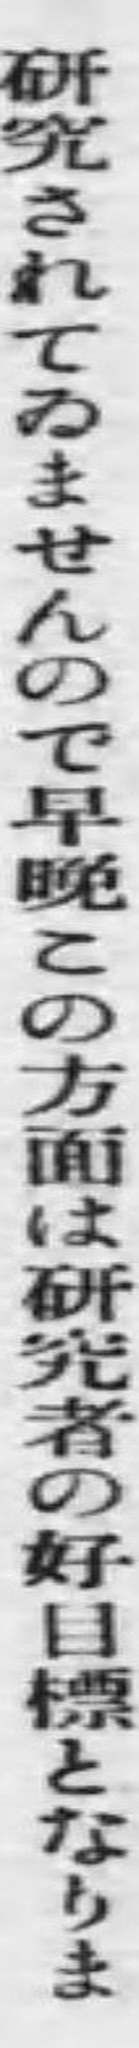研究されてゐませんので早晩この方面は研究者の好目標となりま
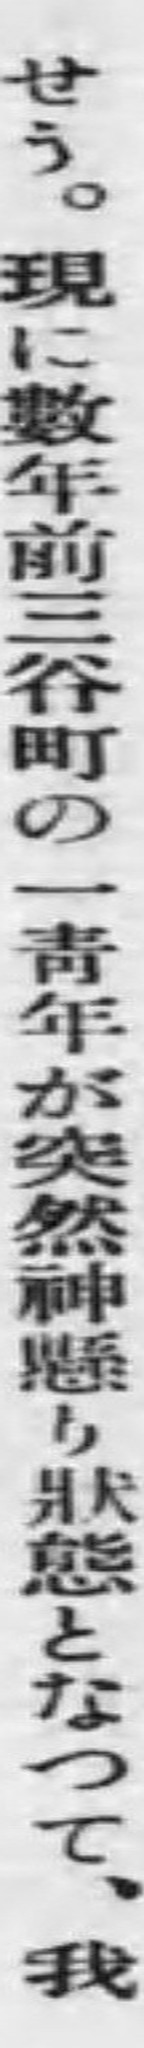せう。現に数年前三谷町の一青年が突然神懸り状態となつて、我
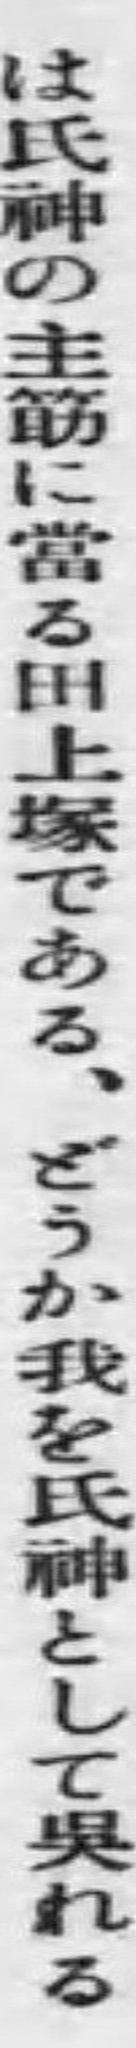は氏神の主筋に当る田上塚である、どうか我を氏神として呉れる
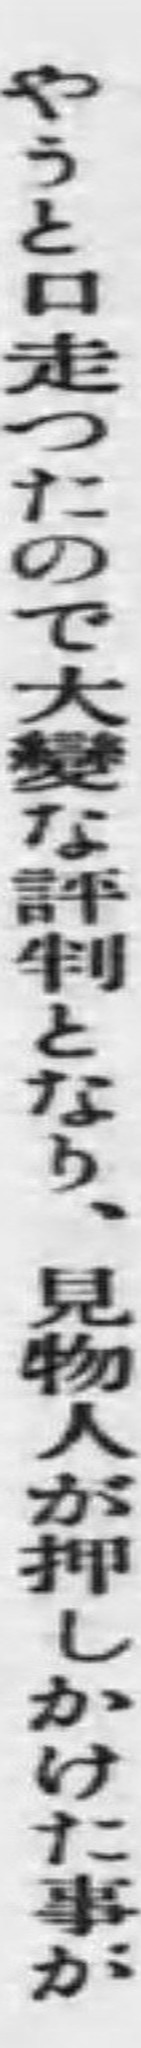やうと口走つたので大変な評判となり、見物人が押しかけた事が
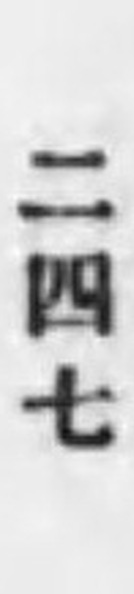二四七

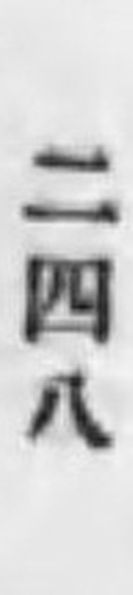二四八
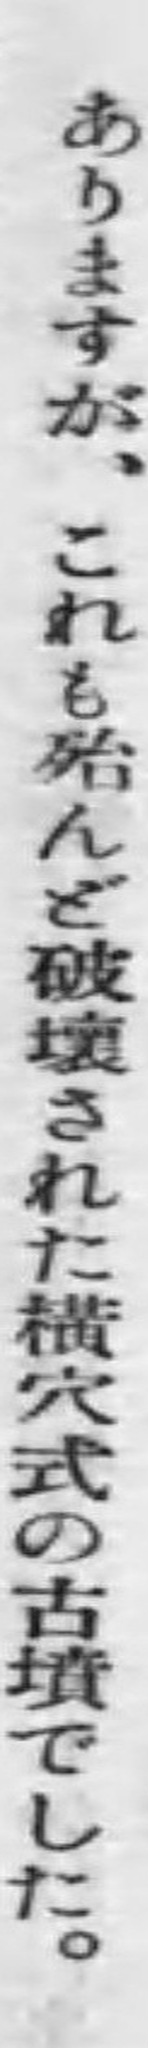ありますが、これも殆んど破壊された横穴式の古墳でした。
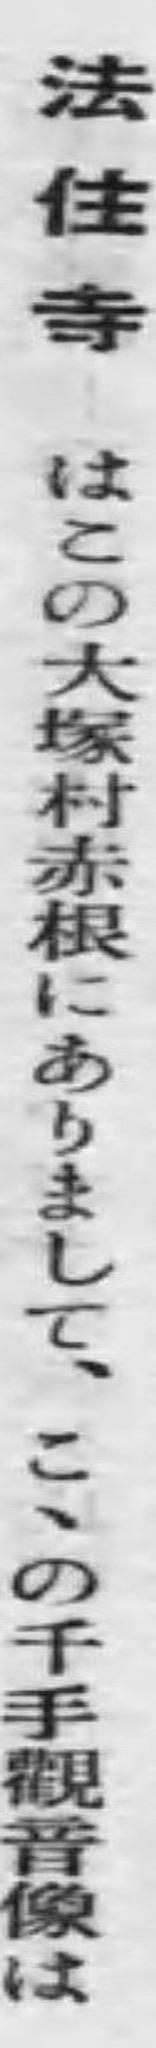法住寺はこの大塚村赤根にありまして、こゝの千手観音像は
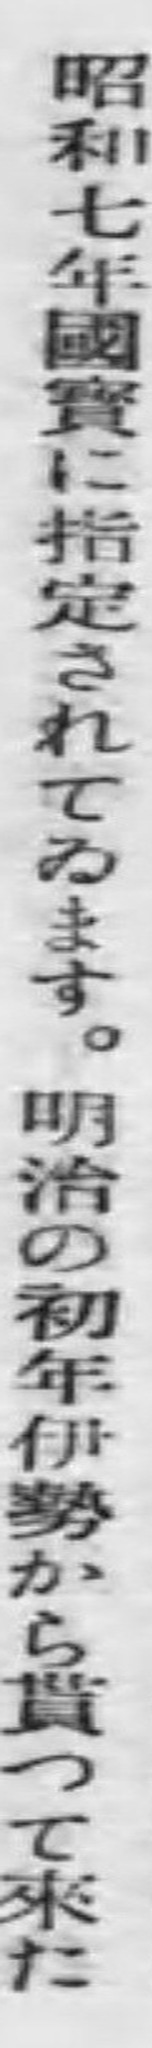昭和七年国宝に指定されてゐます。明治の初年伊勢から貰つて来た
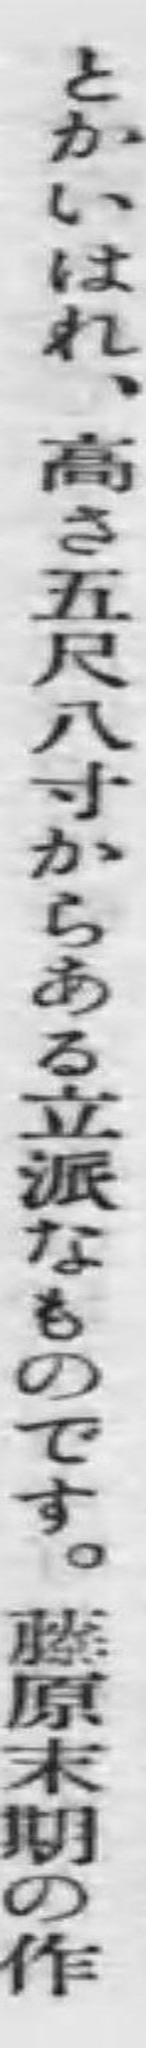とかいはれ、高さ五尺八寸からある立派なものです。藤原末期の作
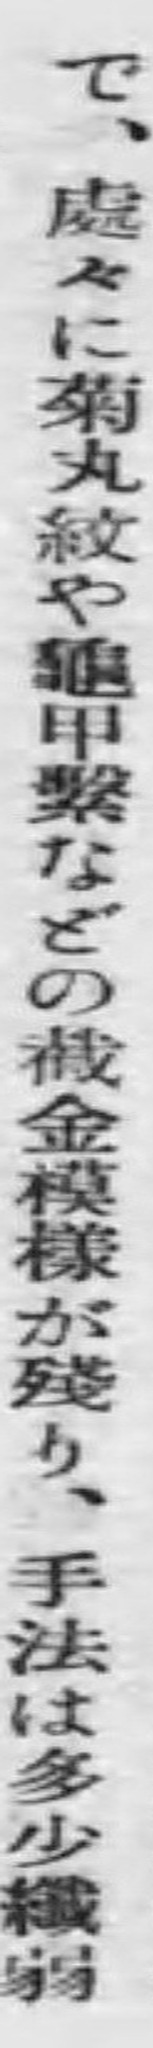で、処々に菊丸紋や亀甲繋などの截金模様が残り、手法は多少繊弱
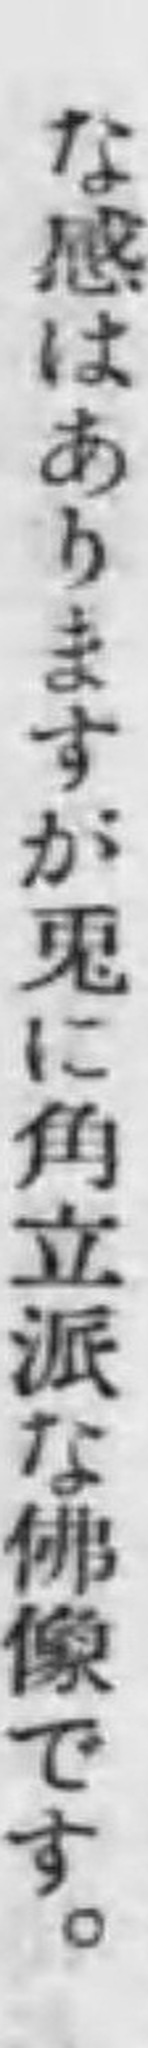な感はありますが兎に角立派な仏像です。
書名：東三河道中記 : 豊橋市及其附近案内
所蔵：国立国会図書館 National Diet Library, JAPAN
